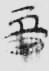○（期）
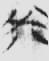癸
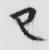巳
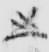之
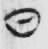日
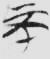不
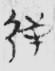○（射）
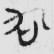叴
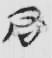君
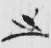之
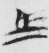馬
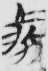駕
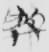與
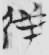○（射）
